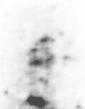之
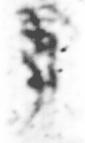○（蒙）
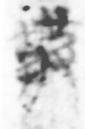○（鞁）
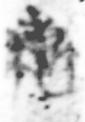○（轡）
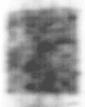哀
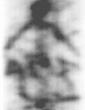哀
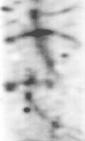立
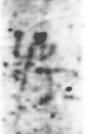○（左）
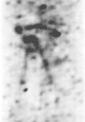尹
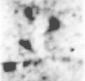之
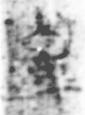車
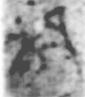○（漆）
